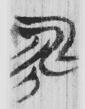永
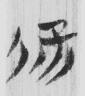保
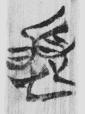{日又頁}
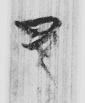邑
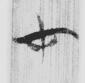才
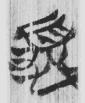{日又頁}
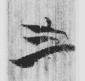之
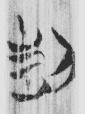{屮二屮刀}
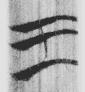王
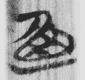廼
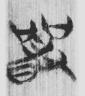嚴
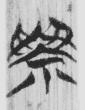{示寅}
